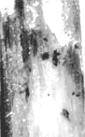疾
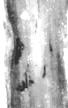少
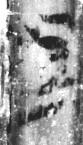翏（瘳）
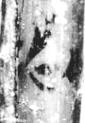申
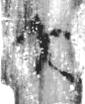大
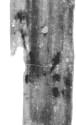翏（瘳）
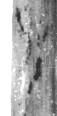死
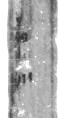生
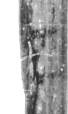才（在）
